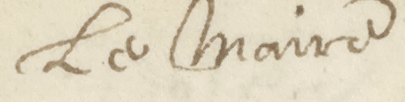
Le Maire
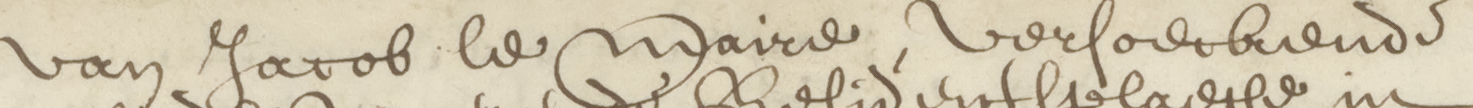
van Jacob le Maire, versoeckende
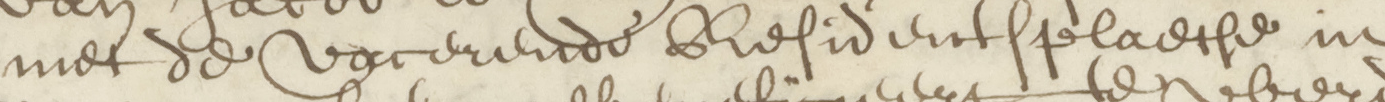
met de vacerende Residentsplaetse in
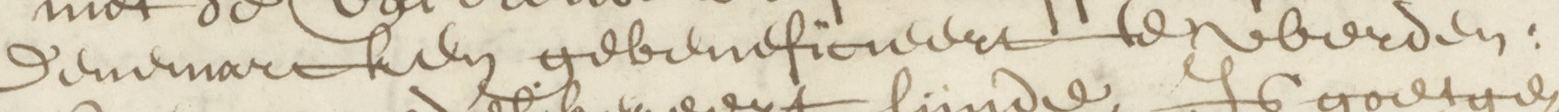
Denemarcken gebeneficieert te werden:
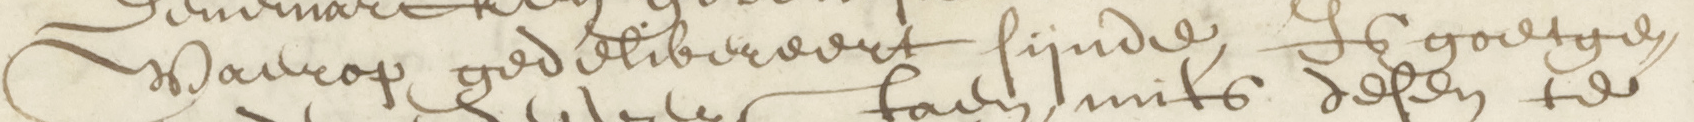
Waerop gedelibereert sijnde, Is goetge„
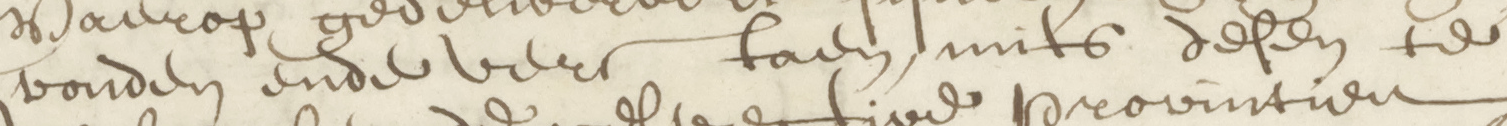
vonden ende verstaen, mits desen te
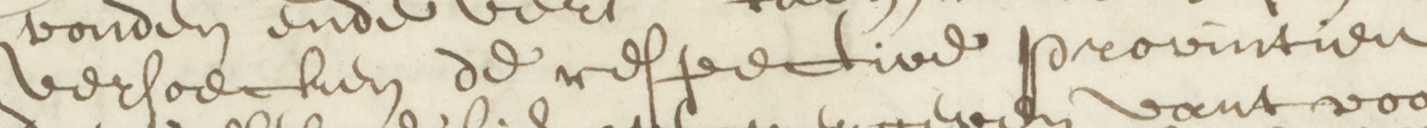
versoecken de respective provintien
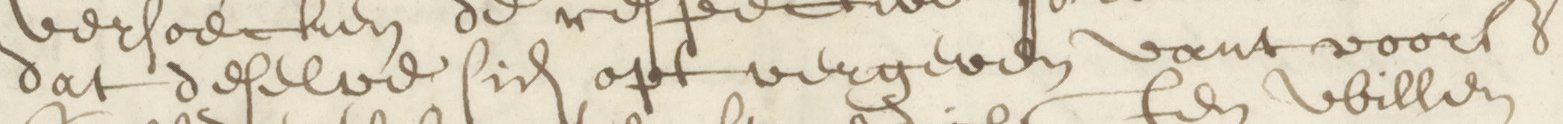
dat deselve sich opt vergeven vant voors
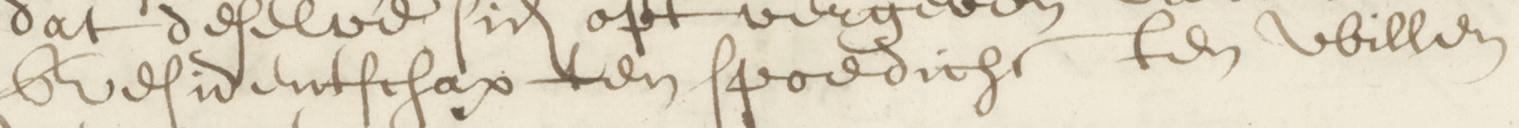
Residentschap ten spoedichsten willen
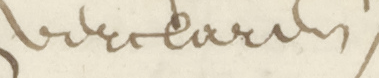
verclaren.
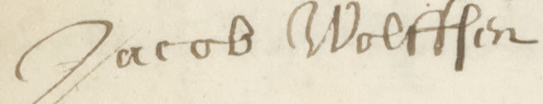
Jacob Wolffsen
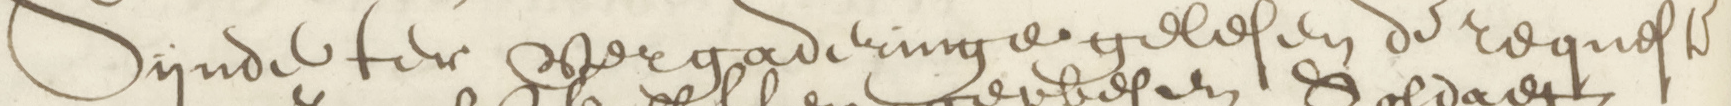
Sijnde ter Vergaderinge gelesen de requeste
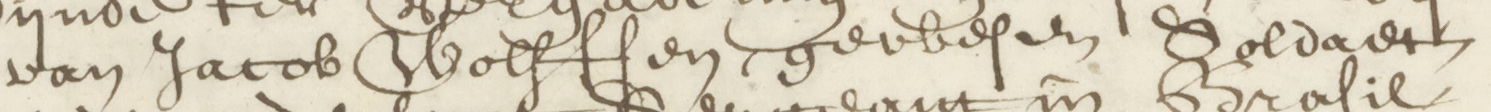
van Jacob Wolffsen, gewesen Soldaet,
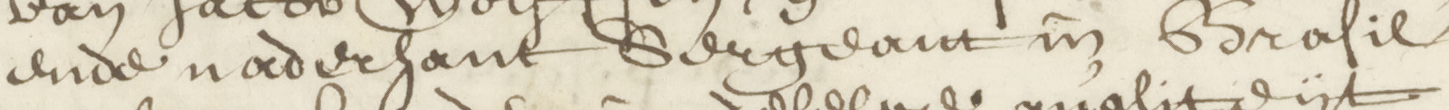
ende naderhant Sergeant in Brasil,
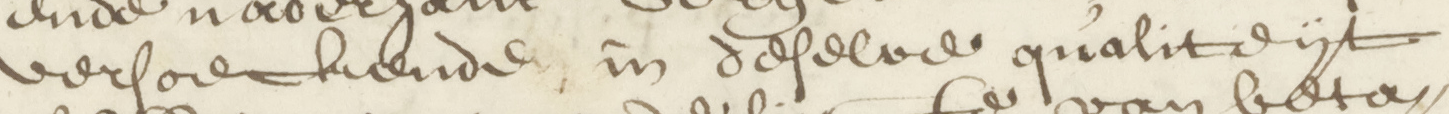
versoeckende in deselve qualiteijt
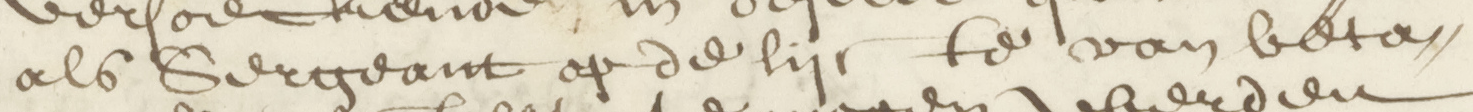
als Sergeant op de lijste van beta„
